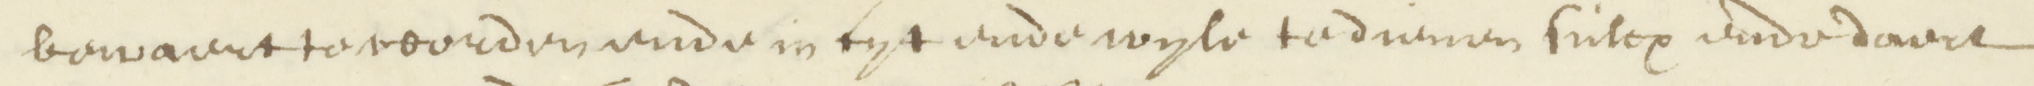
bewaert te worden ende in tyt ende wyle te dienen sulcx ende daert
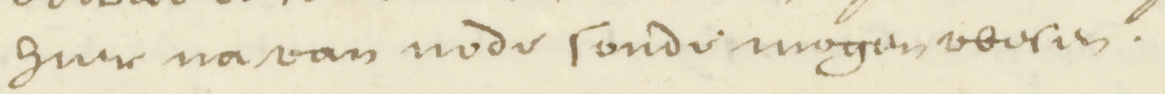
hier na van node soude mogen wesen.
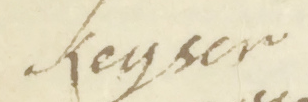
keyser
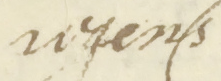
iegens
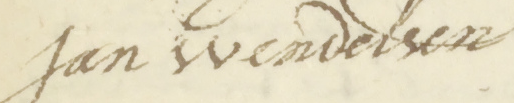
Jan wendelsen
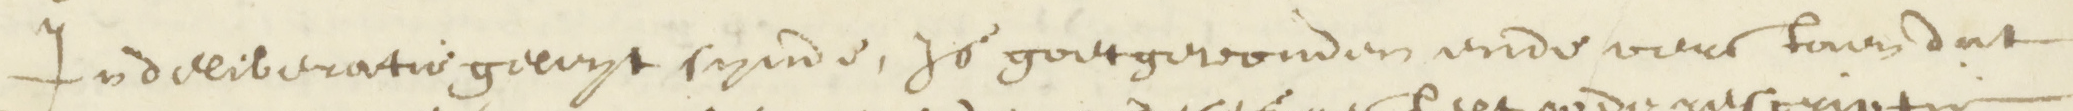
In deliberatie geleyt synde, Is goetgevonden ende verstaen dat
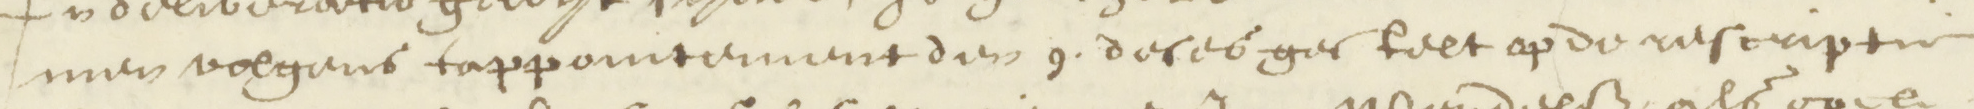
men volgens tappointement den 9. deses gestelt op de rescriptie
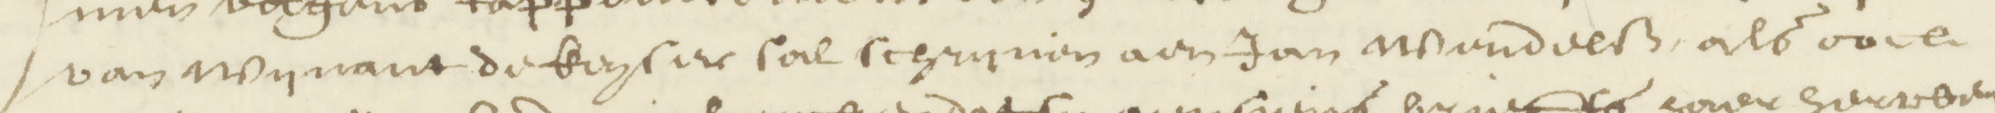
van Wynant de Keyser sal schryven aen Jan Wendelsz, als oock
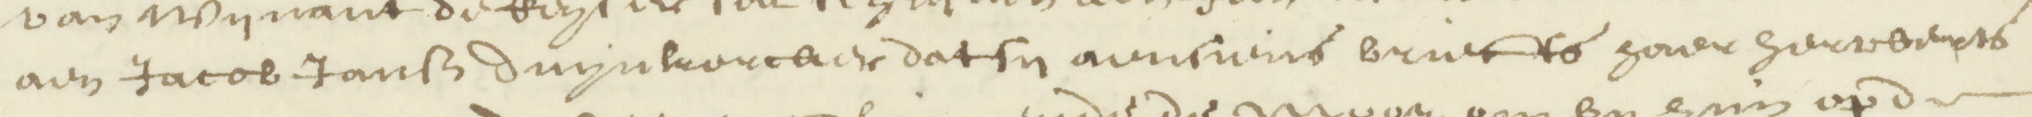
aen Jacob Jansz Duijnkercker dat sy aensiens brieffs haer herwerts
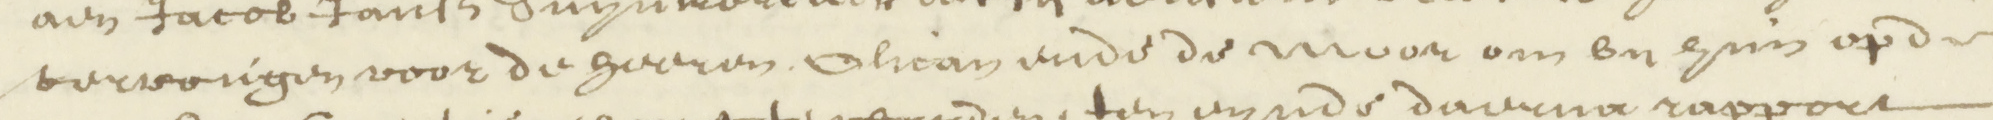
vervougen voor de heeren Olican ende de Moor om by hun op de
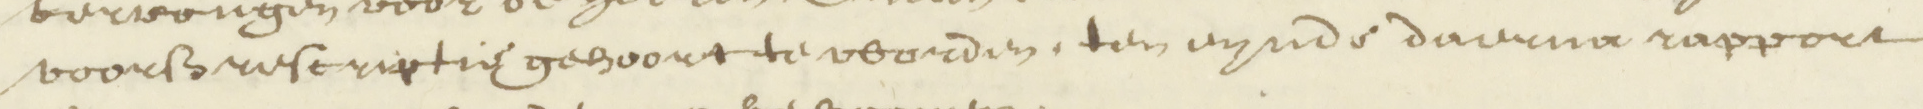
voors rescriptie gehoort te worden, ten eynde daerna rapport
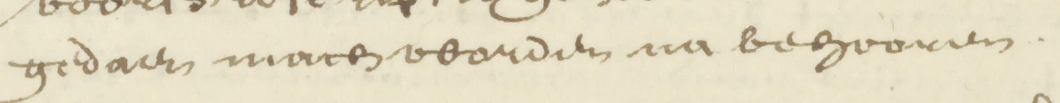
gedaen mach worden na behooren.
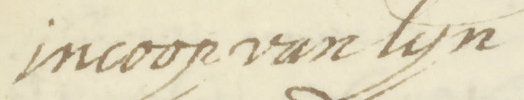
incoop van lyn
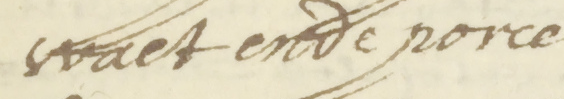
waet ende porce
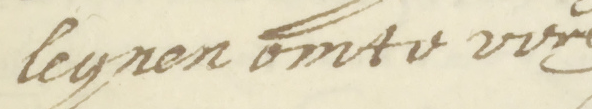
leynen omte ver
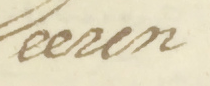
eeren
